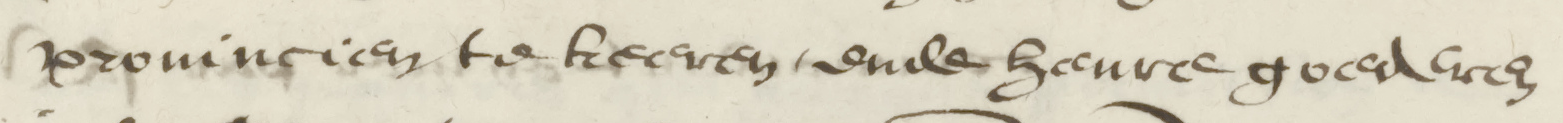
prouincien te keeren, ende heure goederen
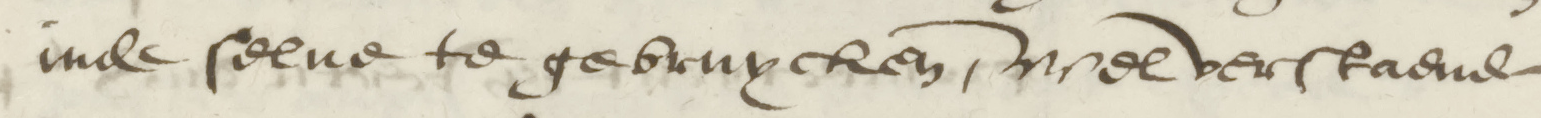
inde selue te gebruycken, wel verstaende
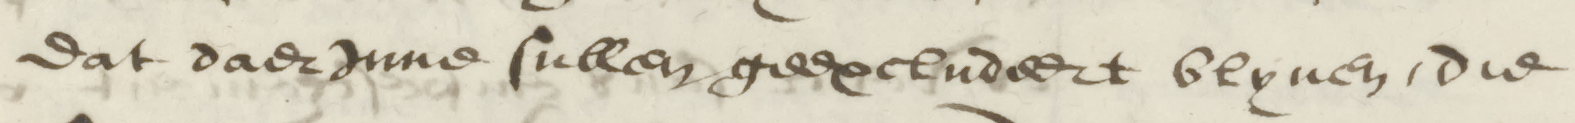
dat daerinne sullen geexcludeert blyuen, die
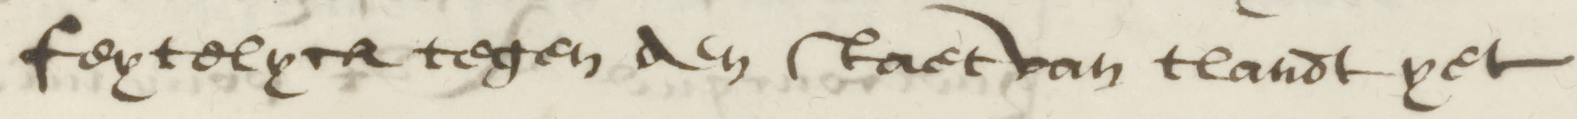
feytelyck tegen den staet van tlandt yet
